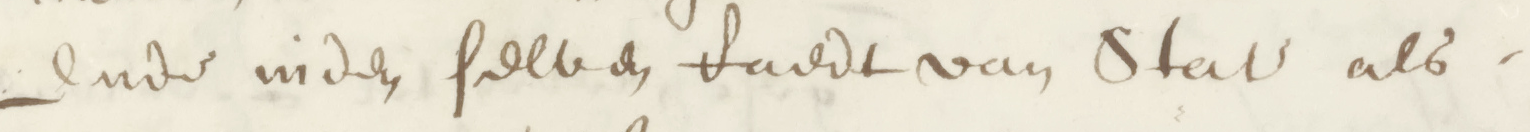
ende inden selven Raedt van State als
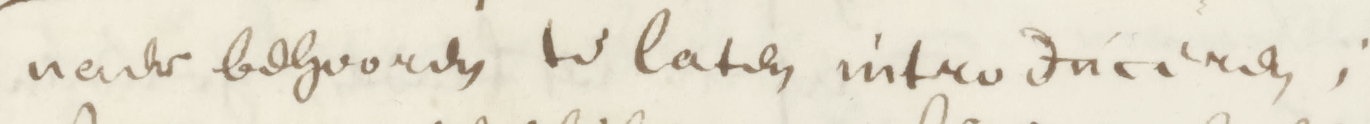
naer behooren te laten introduceren;
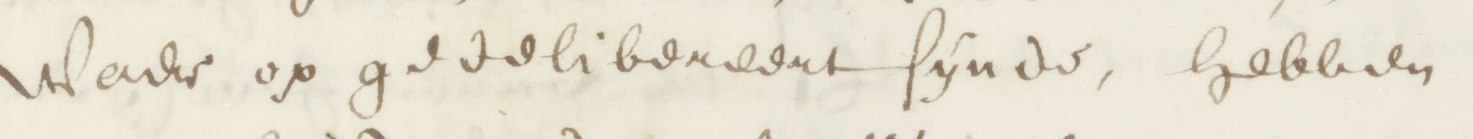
Waer op gedelibereert sijnde, hebben
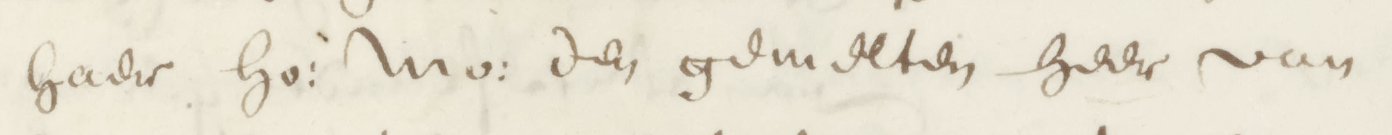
haer ho:mo: den gemelten heer van
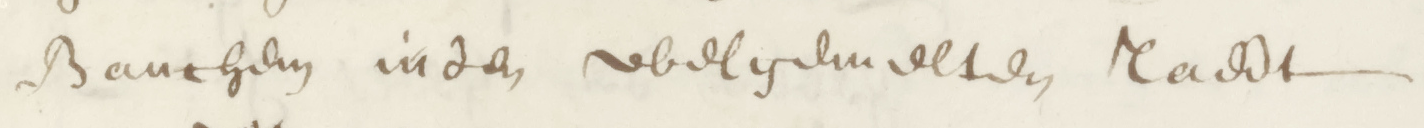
Banchem inden welgemelten raedt
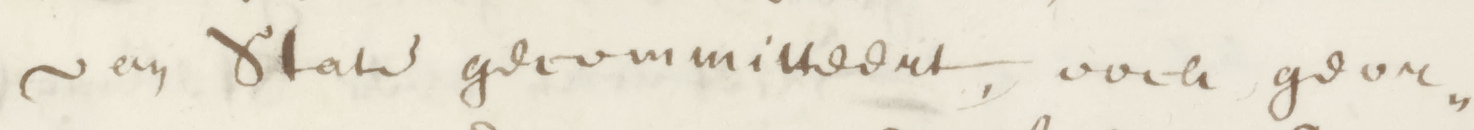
van State gecommitteert, oock geor„
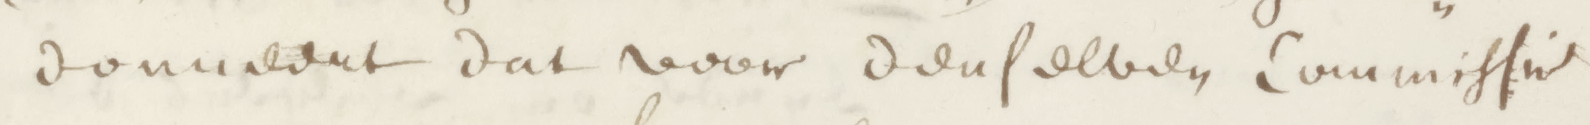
donneert dat voor denselven Commissie
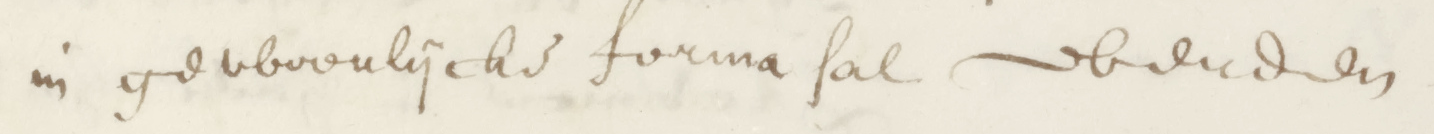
in gewoonlijcke forma sal werden
